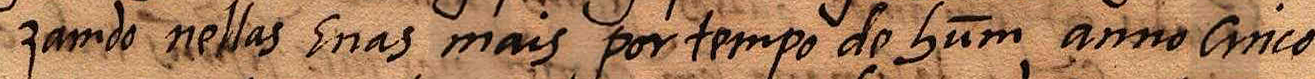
zamdo nellas E nas mais por tempo de hūm anno cinco
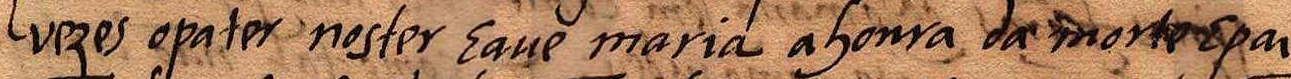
vezes o pater noster E aue maria a honra da morte e pai
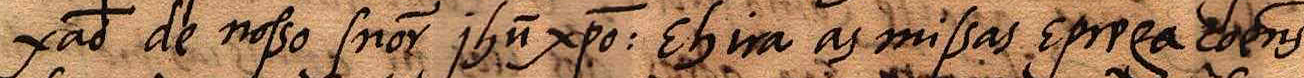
xão de nosso snor̄ jhū xpō: E hira as missas E pregaçoens
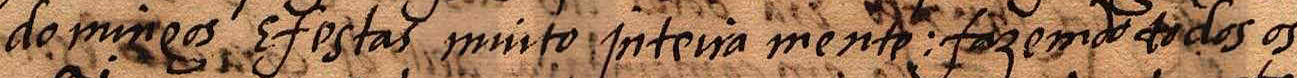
domingos e festas muito jnteiramente: fazemdo todos os
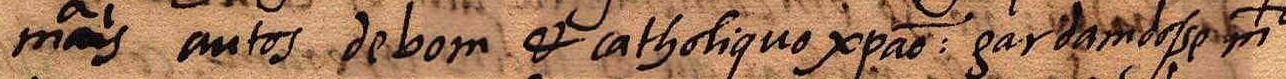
mais autos de bom & catholiquo xpaõ: gardamdosse mto
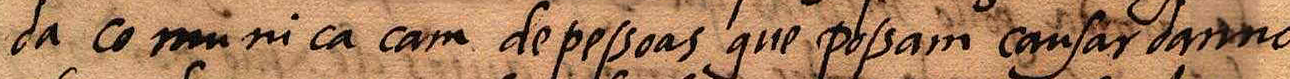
da comunicaçam de pessoas que possam causar danno
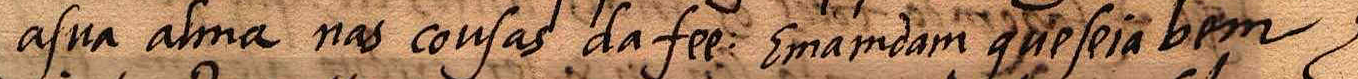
a sua alma nas cousas da fee: E mamdam que seia bem
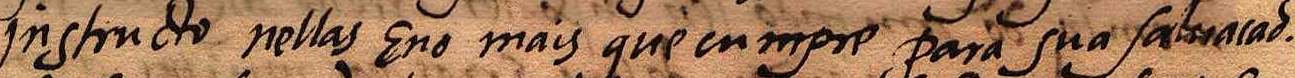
jnstructo nellas E no mais que cumpre para sua saluaçaõ:
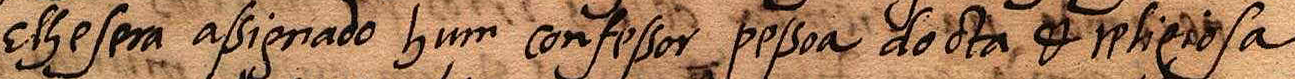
E lhe sera assignado hum confessor pessoa docta & religiosa
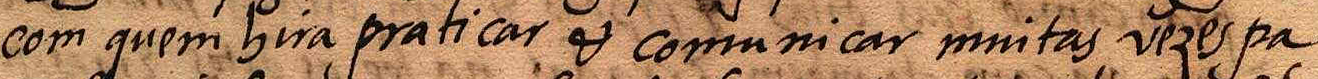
com quem hira praticar & comunicar muitas vezes pa
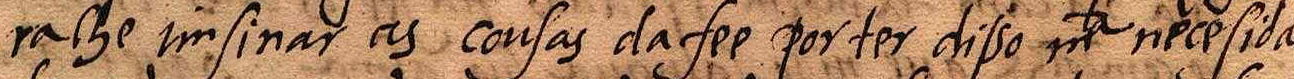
ra lhe imsinar as cousas da fee por ter disso mta necesida
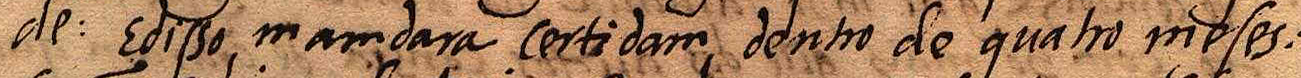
de: E disso mandara certidam dentro de quatro meses:
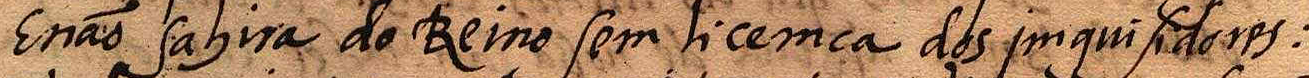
E não sahira do Reino sem licemça dos jmquisidores:
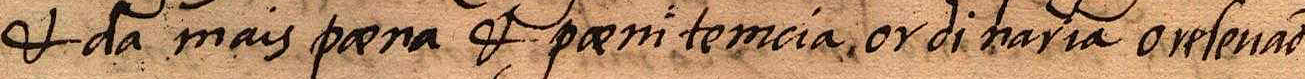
& da mais pœna & pœnitemcia ordinaria o releuaõ
